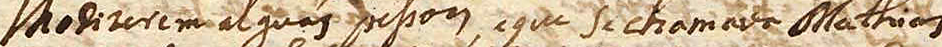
lho dizerem alguās pessoas, e que se chamava Mathias
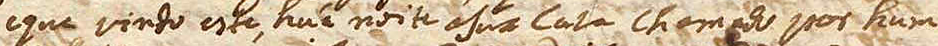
e que vindo este huā noite a sua caza chamado por hum
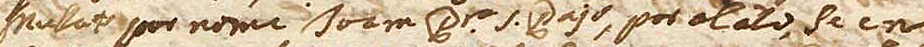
mulato por nome Ioam P.ra s. Pajo, por acazo se en
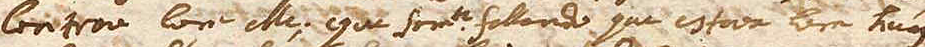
controu com elle; e que som.te fallando que estava com huās
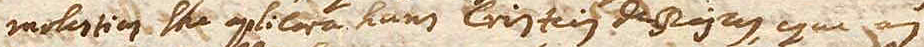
molestias lhe aplicara huns cristeis de rajzes, e que as
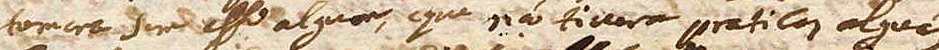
tomara sem esf.o algum, e que não tivera praticas alguās
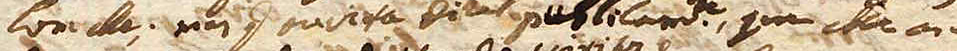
com elle, mas q̄ ouvira dizer publicam.te, que elle an
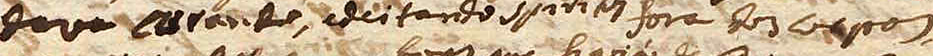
dava curando, e deitando spiritos fora dos corpos
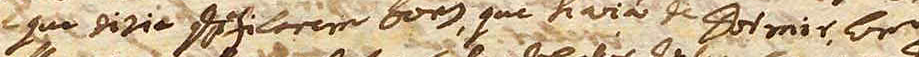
que dizia q̄ p.a ficarem bons, que haviaõ de dormir, Com
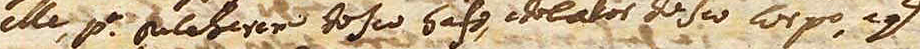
elle, pa. receberem do seo bafo, e do calor de seo corpo, e q̄
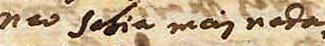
naõ sabia mais nada.
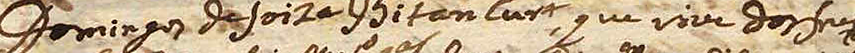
Domingos de Soiza Bitancurt, que vive dos frutos
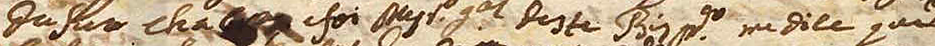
da sua chacara e foi Meyr.o g.al deste Bisp.do me dice que
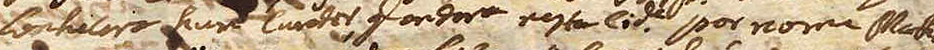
conhecera hum curador, q̄ andava nesta cid.e por nome Mathi
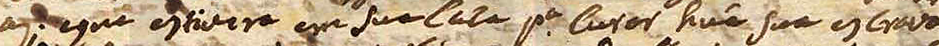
as; e que estivera em Sua Caza p.a curar huā sua escrava
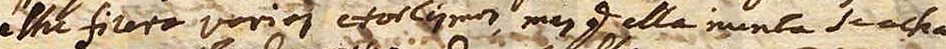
e lhe fizera varios exorcismos, mas q̄ ella nunca se acha
